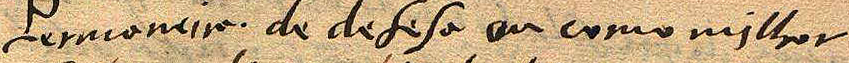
Per maneira de defesa ou como mjlhor
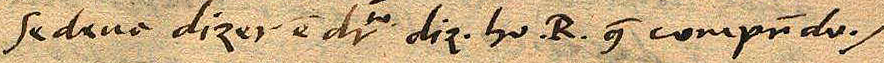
se deua dizer ē drto diz. ho .R. q̄ comprīdo ./
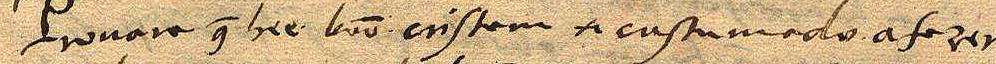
Prouara q̄ hee boō cristam e custumado a fazer
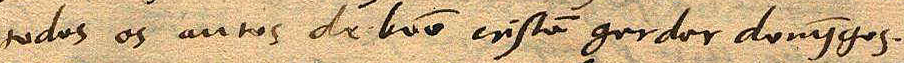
todos os autos de boō cristā gardar domj̄gos.
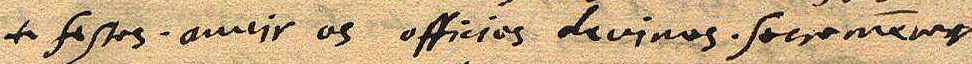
e festas . ouuir os officios deuinos . sacramēmos
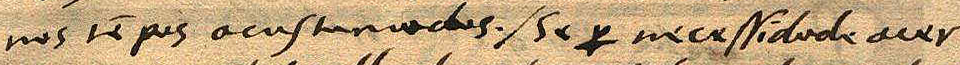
nos tēpos acustumados ./ se ꝑ neçessidade acer
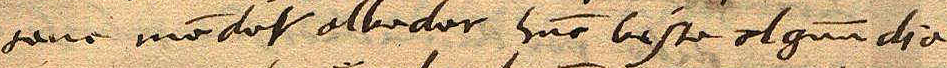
taua mādar albadar hūa besta algūu dia
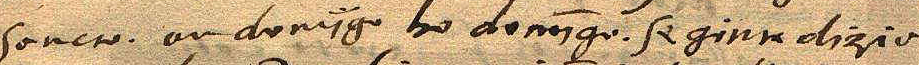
sancto ou domj̄go ho domj̄go . seginte dizia
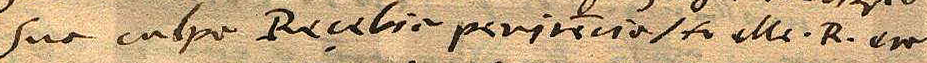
sua culpa Reçebia pejitēcia / e elle .R. era
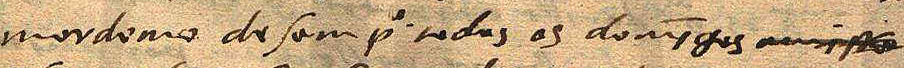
mordomo de sam po. todos os domj̄gos
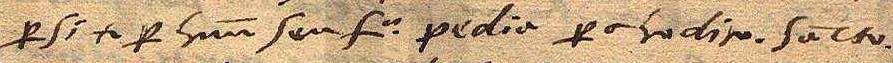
ꝑ si e ꝑ huū seu fo. pedia ꝑa ho dito . sācto.
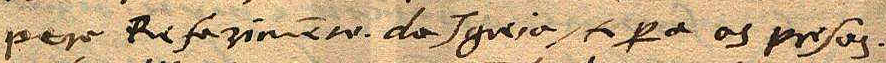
pera Refazimēto da Jgreia / e ꝑa os presos.
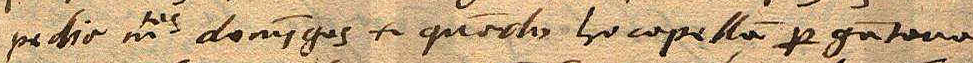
pedia mtos domj̄gos e quādo ho capellā ꝑgūtaua
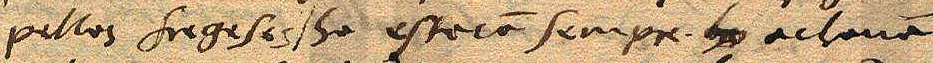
pellos fregeses / ho esteiā sempre ho achauā
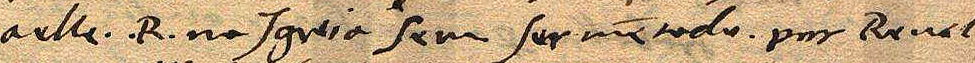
a elle .R. na Jgreia sem ser mētado . por Reuel
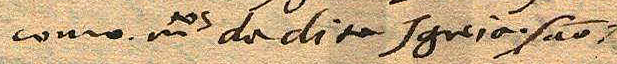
como mtos da dita Jgreia. são ./
